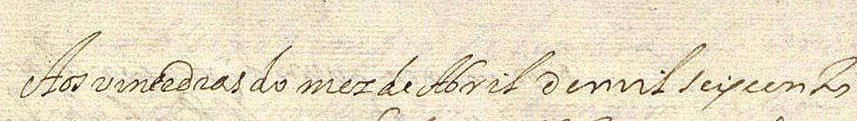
Aos vinte dias do mez de Abril de mil seiscentos
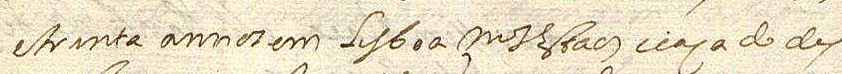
e trinta annos em Lisboa nos Estaos e caza do des
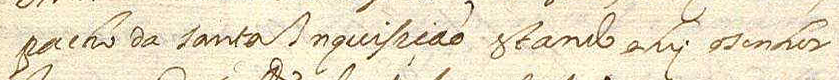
pacho da santa Inquisiçaõ estando ahy o senhor
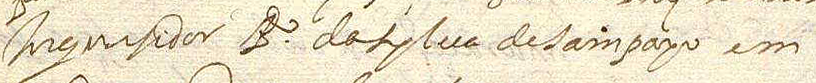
Inquisidor Po. da sylua de sampayo em
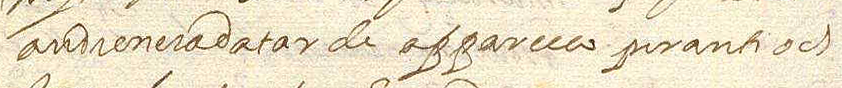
audiencia da tarde appareceo perante o di
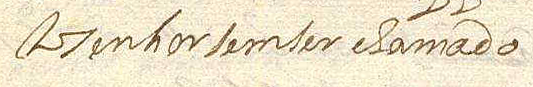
to senhor sem ser chamado
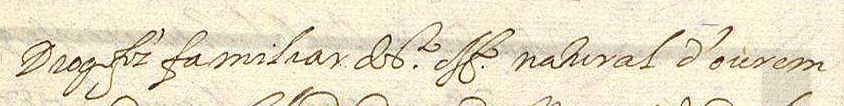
Diogo frz̄ familiar do s.to off.o natural d'ourem
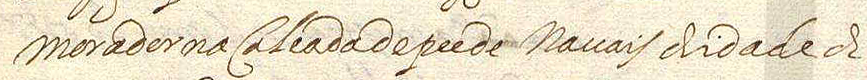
morador na Calçada de pee de nauais didade de
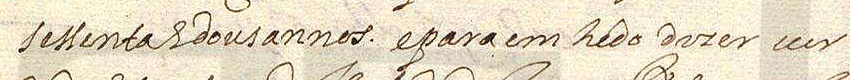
sessenta E dous annos; e para em tudo dizer uer
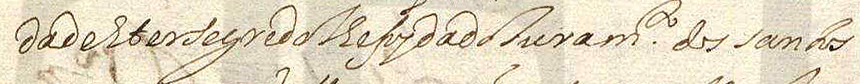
dade E ter segredo lhe foy dado Iuram.to dos santos
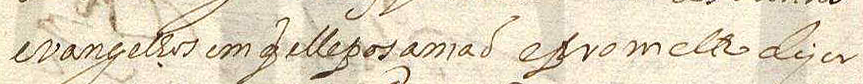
evangelhos em q̄ elle pos a maõ e prometto dizer
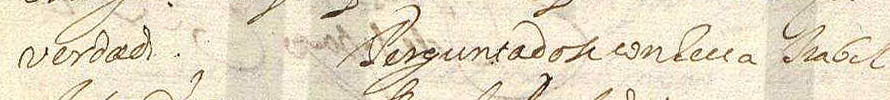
verdad. Perguntado se conhecia Izabel
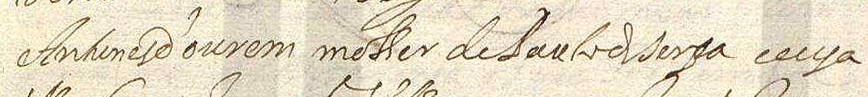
Antunes d'ourem molher de Paulo d serpa cuya
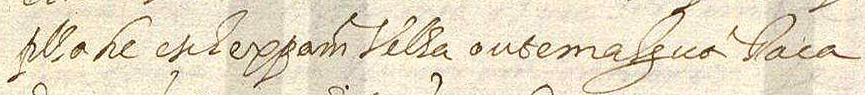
filha he e se he xpam̄ Velha ou tem alguā Raça
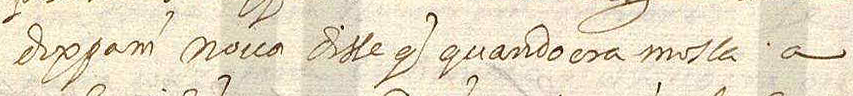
de xpam̄ noua disse q̄ quando era mossa a
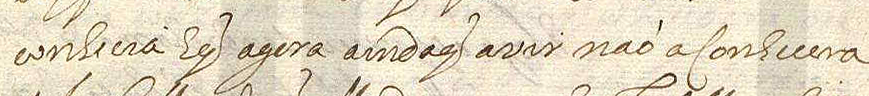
conhecia E q̄ agora ainda q̄ a vir naõ a Conhecera
